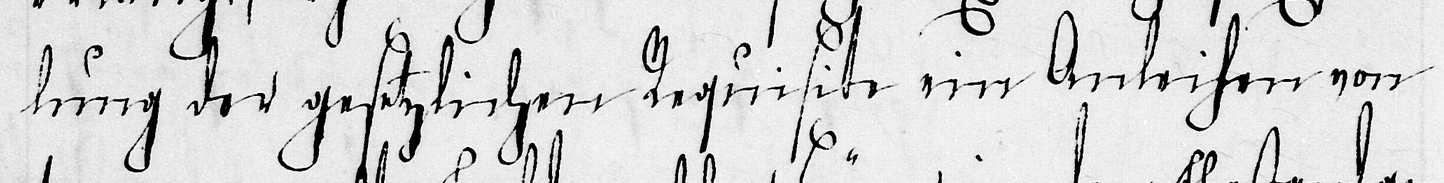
lung der gesetzlichen Requisite ein Anleihen von
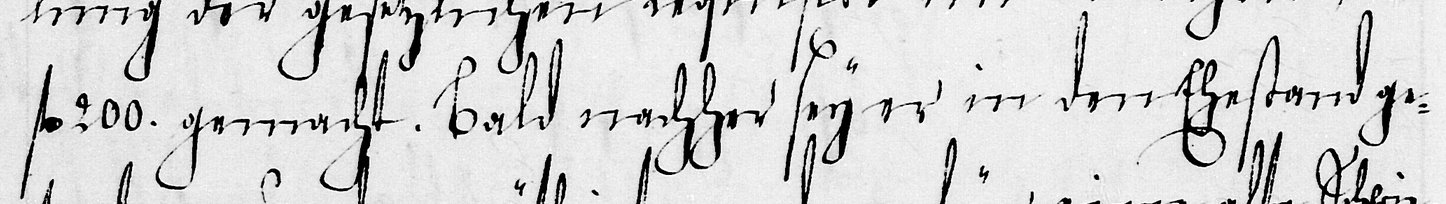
l. 200. gemacht. Bald nachher sey er in den Ehestand ge¬
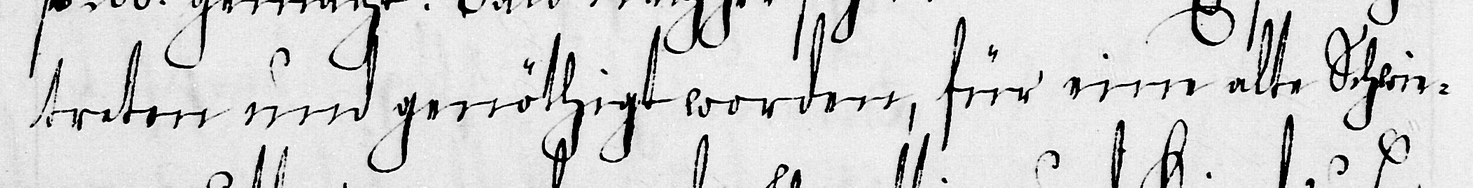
treten und genöthigt worden, für eine alte Schwie¬
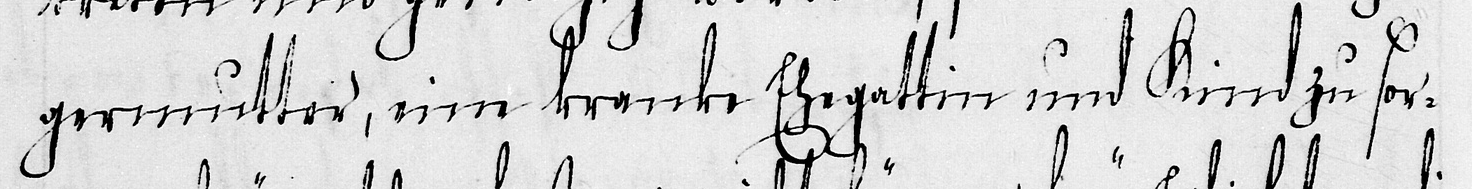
germutter, eine kranke Ehegattin und Kind zu sor¬
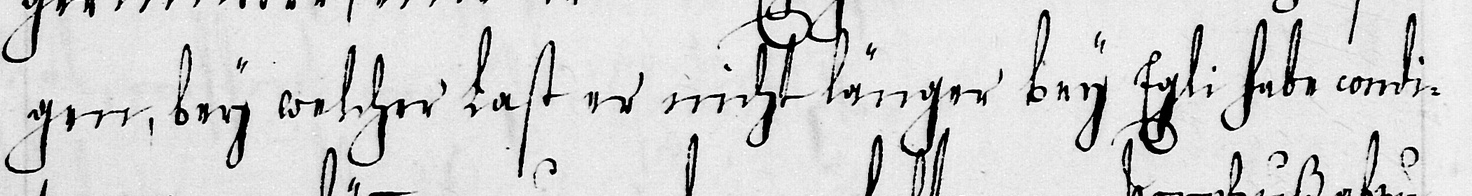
gen, bey welcher Last er nicht länger bey Egli habe condi¬
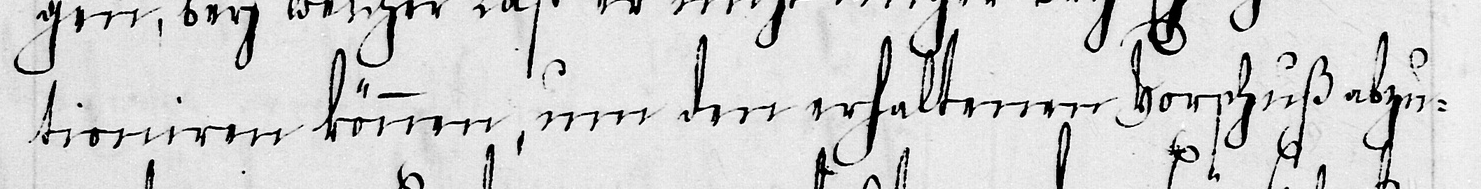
tioniren können, um den erhaltenen Vorschuß abzu¬
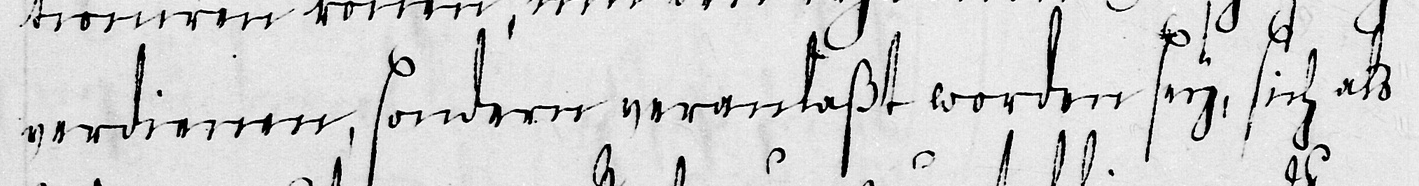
verdienen, sondern veranlaßt worden sey, sich als
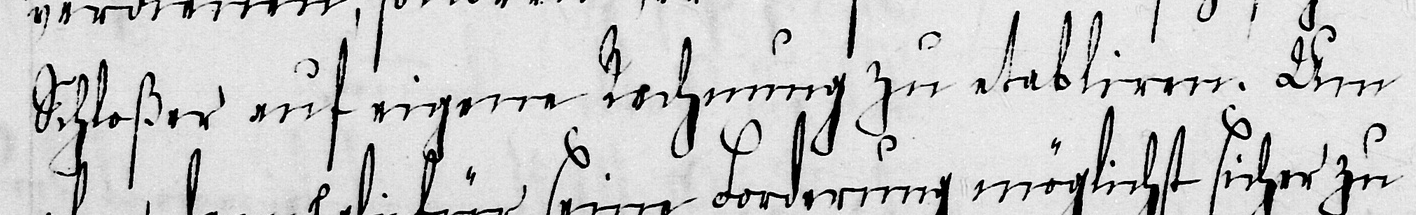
Schloßer auf eigene Rechnung zu etabliren. Um
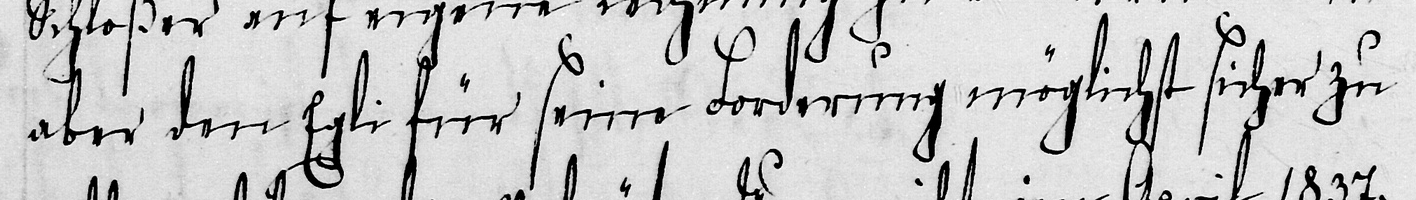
aber den Egli für seine Forderung möglichst sicher zu
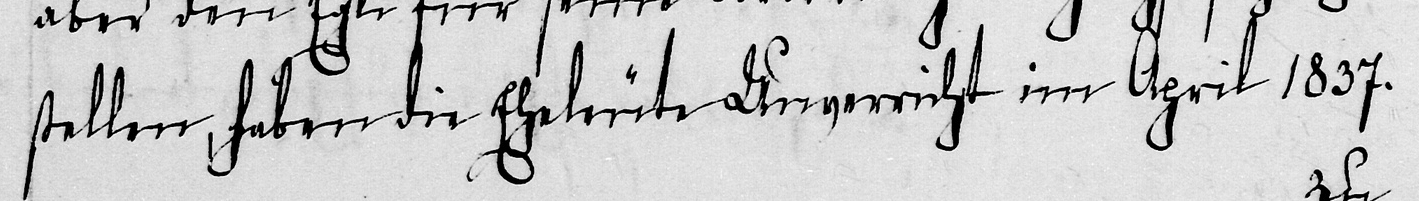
stellen, haben die Eheleute Unverricht im April 1837.
